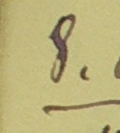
8
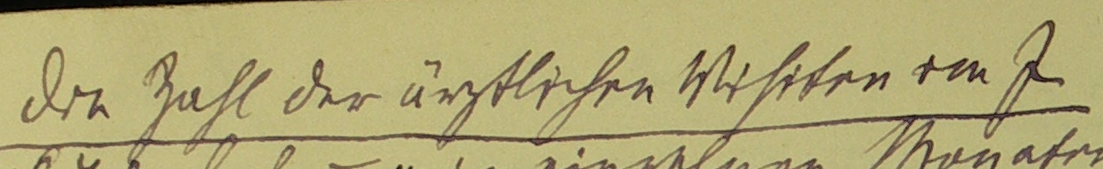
Die Zahl der ärztlichen Visiten im Jahr
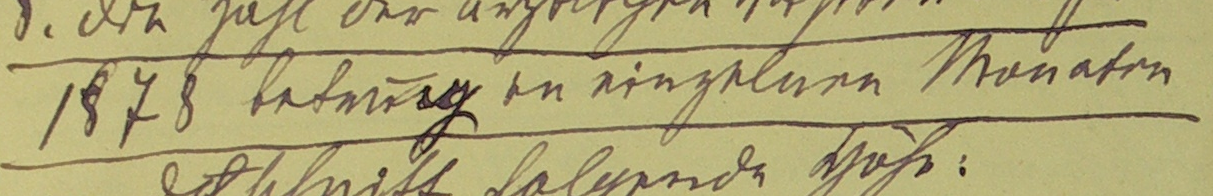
1878 betrug in einzelnen Monaten
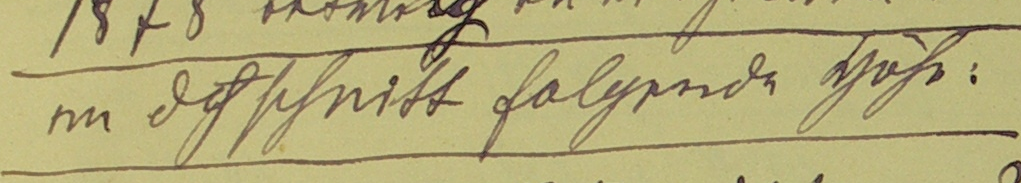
im Durchschnitt folgende Höhe:
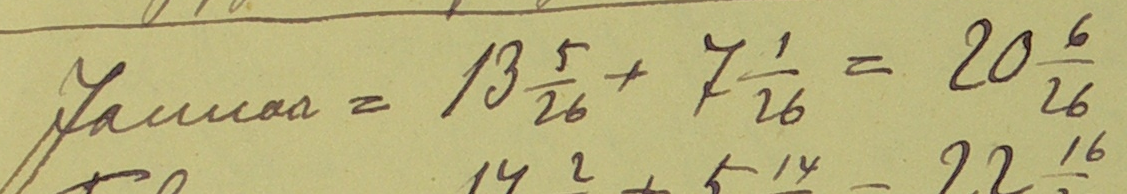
Januar = 13 5/26 + 7 1/26 = 20 6/26
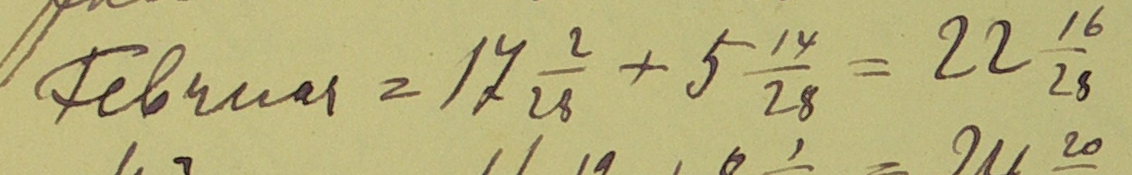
Februar = 17 2/28 + 5 14/28 = 22 16/28
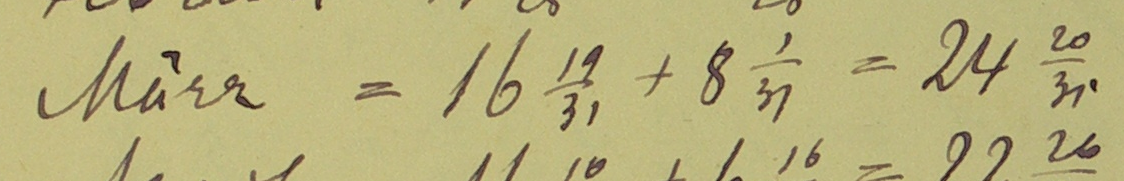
März = 16 19/31 + 8 1/31 = 24 20/31
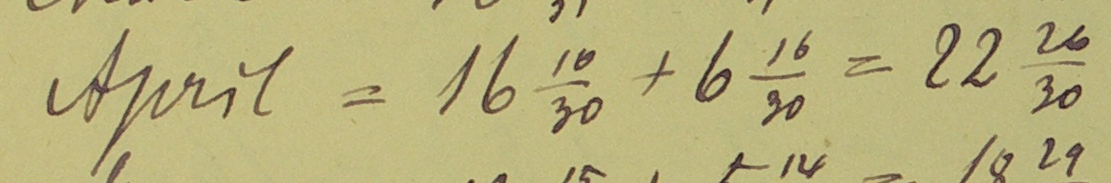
April = 16 10/30 + 6 16/30 = 22 26/30
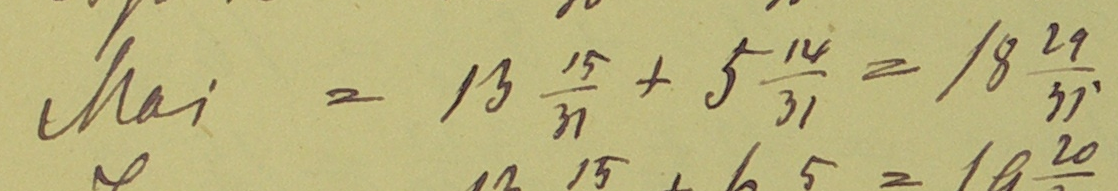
Mai = 13 15/31 + 5 14/31 = 18 29/31
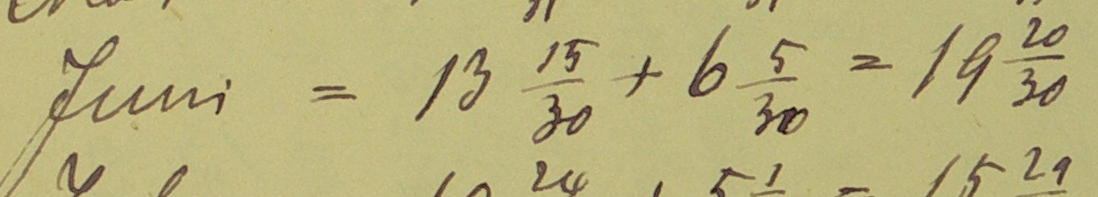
Juni = 13 15/30 + 6 5/31 = 19 20/31
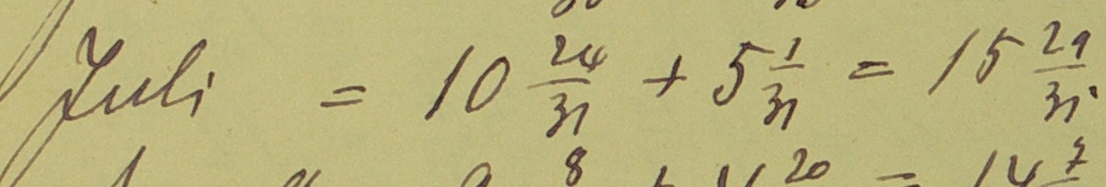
Juli = 10 24/31 + 5 1/31 = 15 29/31
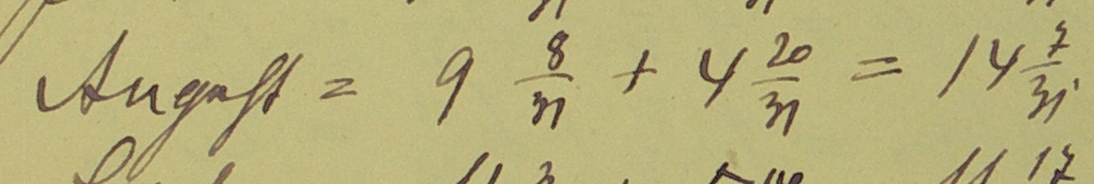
August = 9 8/31 + 4 20/31 = 14 7/31
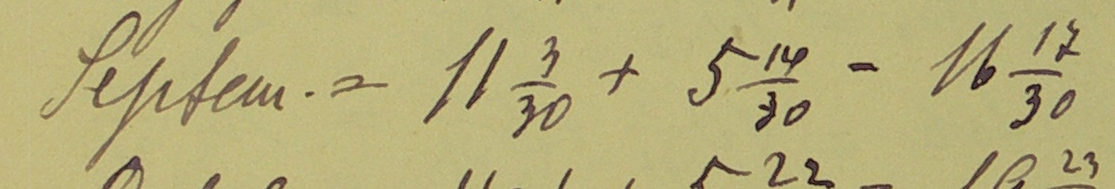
Septem. = 11 3/30 + 5 14/30 = 16 17/30
